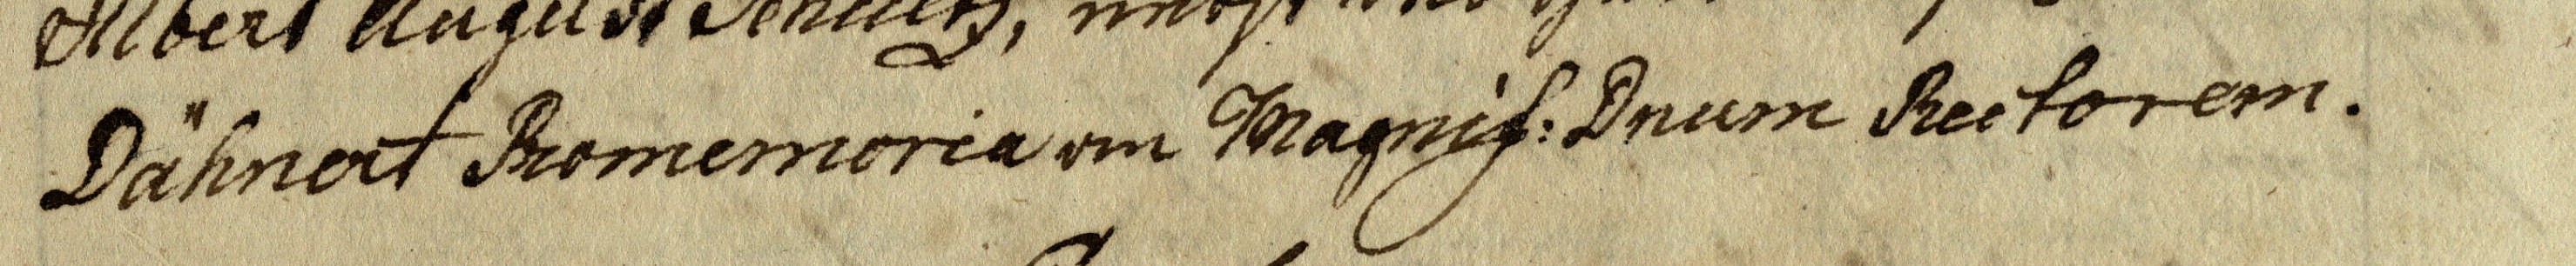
Dähnert Promemoria an Magnif. Dnum Rectorem.
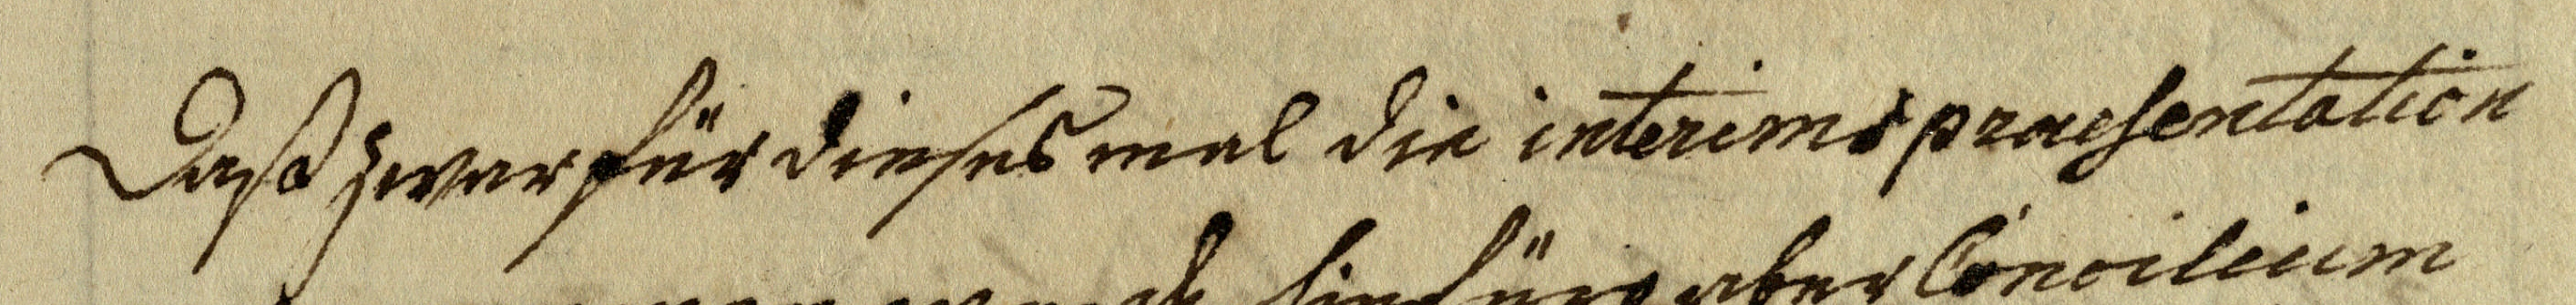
Daß zwar für dieses mal die interimspraesentation
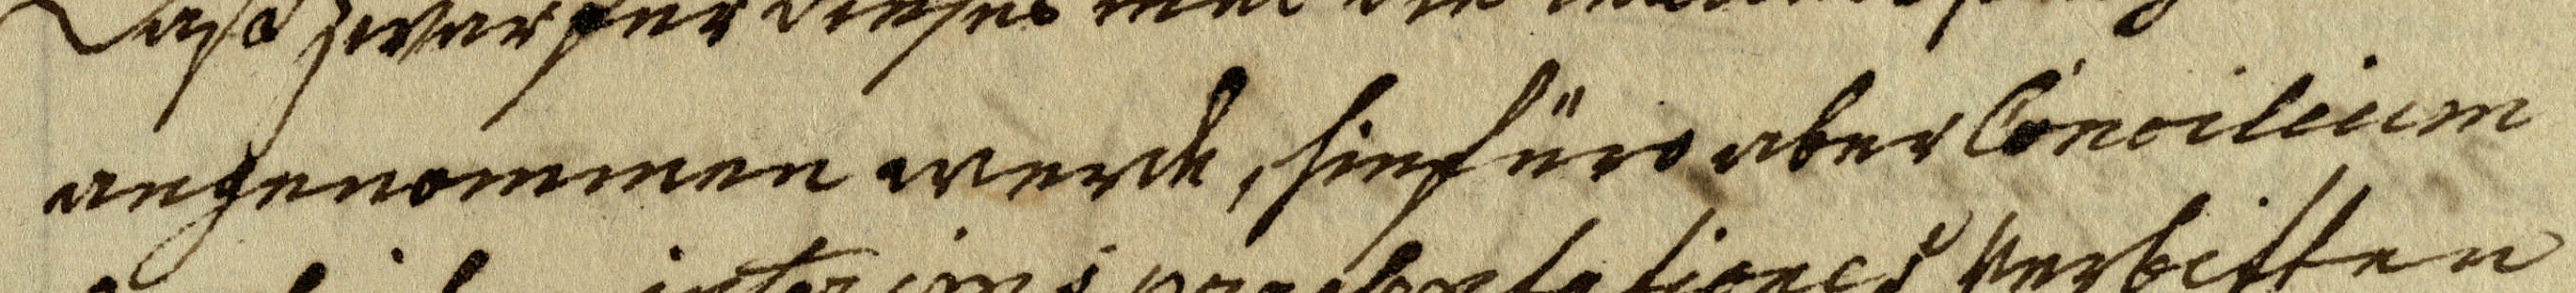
angenommen werde, hiefüro aber Concilium
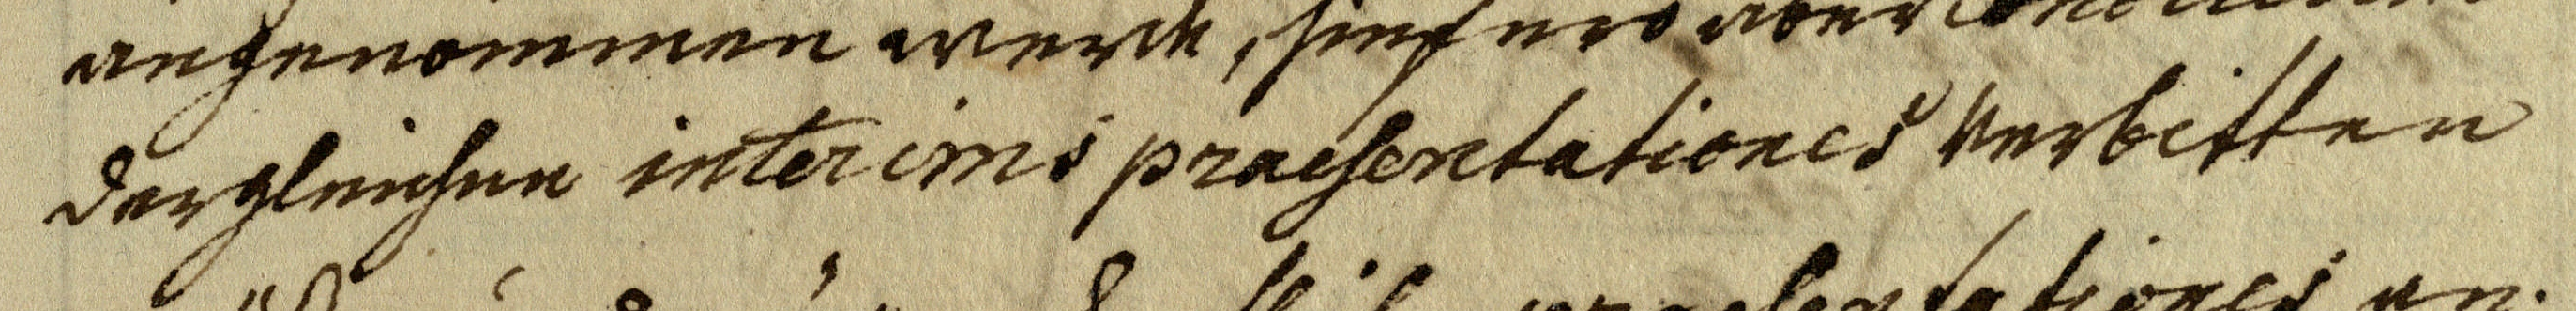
dergleichen interimspraesentationes verbitten
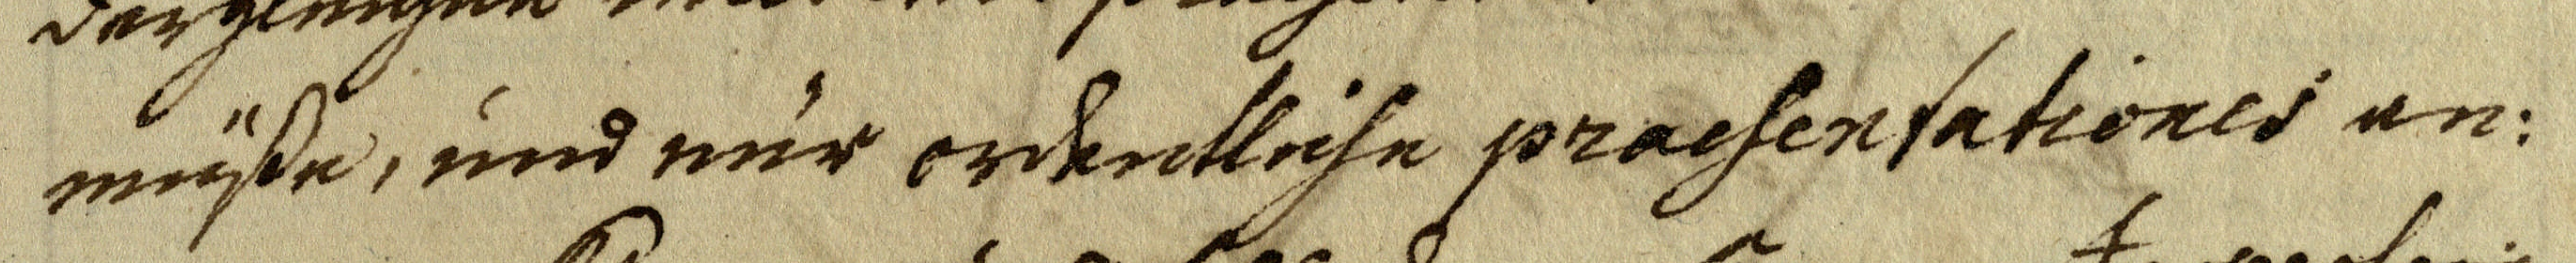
müße, und nur ordentliche praesentationes an¬
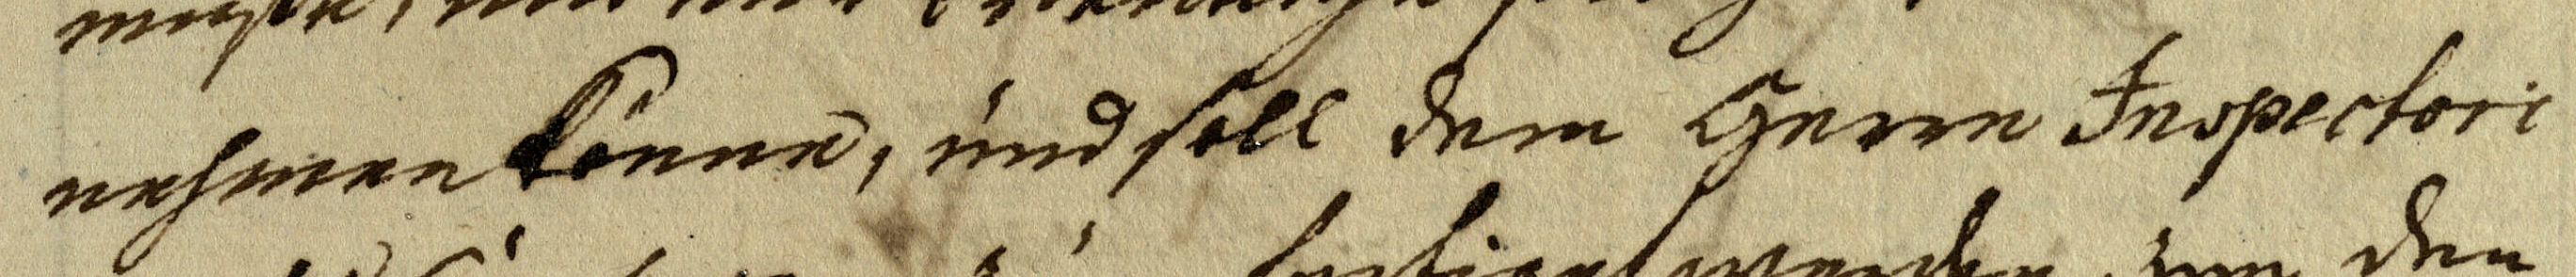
nehmen können, und soll dem Herrn Inspectori
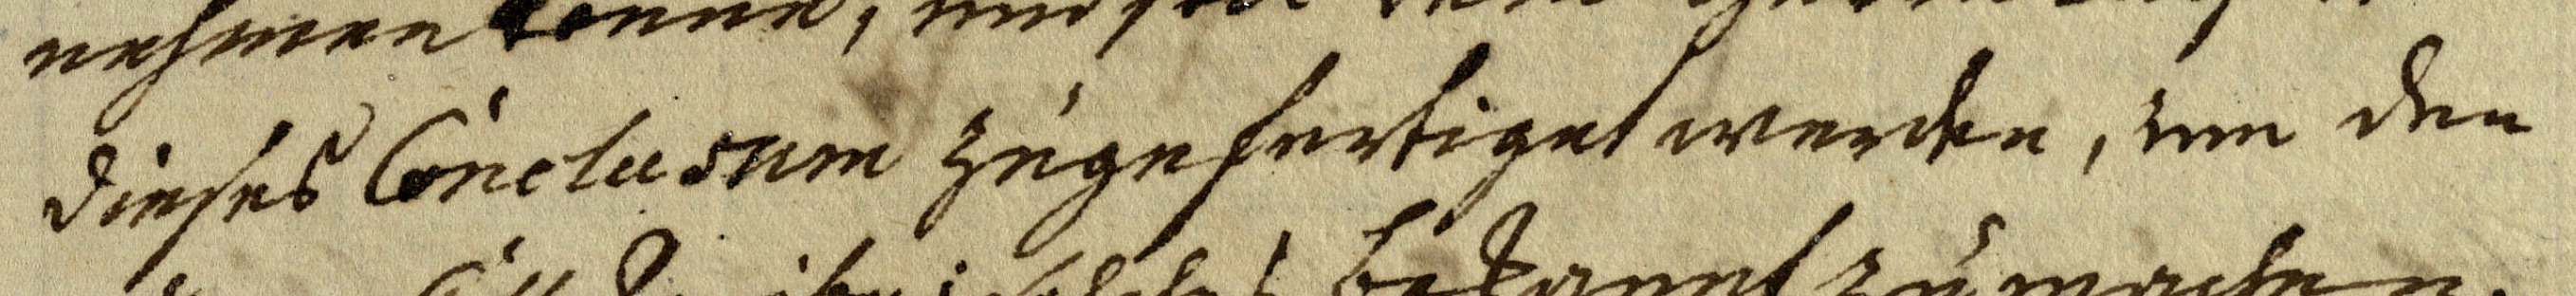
dieses Conclusum zugefertiget werden, um den
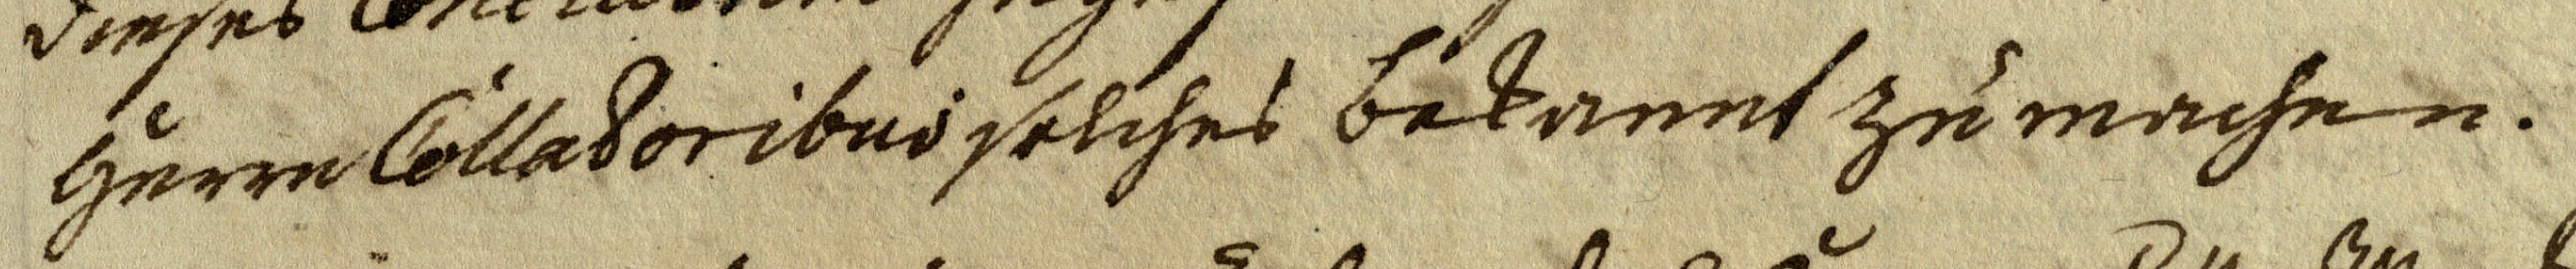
Herrn Collatoribus solches bekannt zu machen.
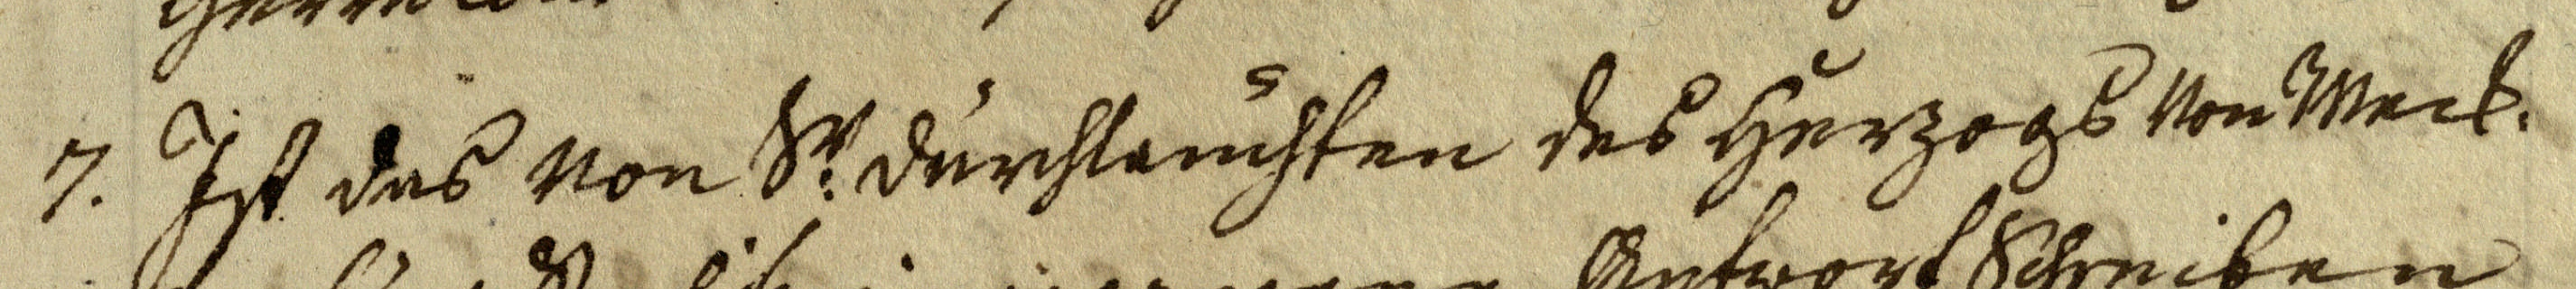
7. Ist das von Sr. Durchlauchten des Herzogs von Meck¬
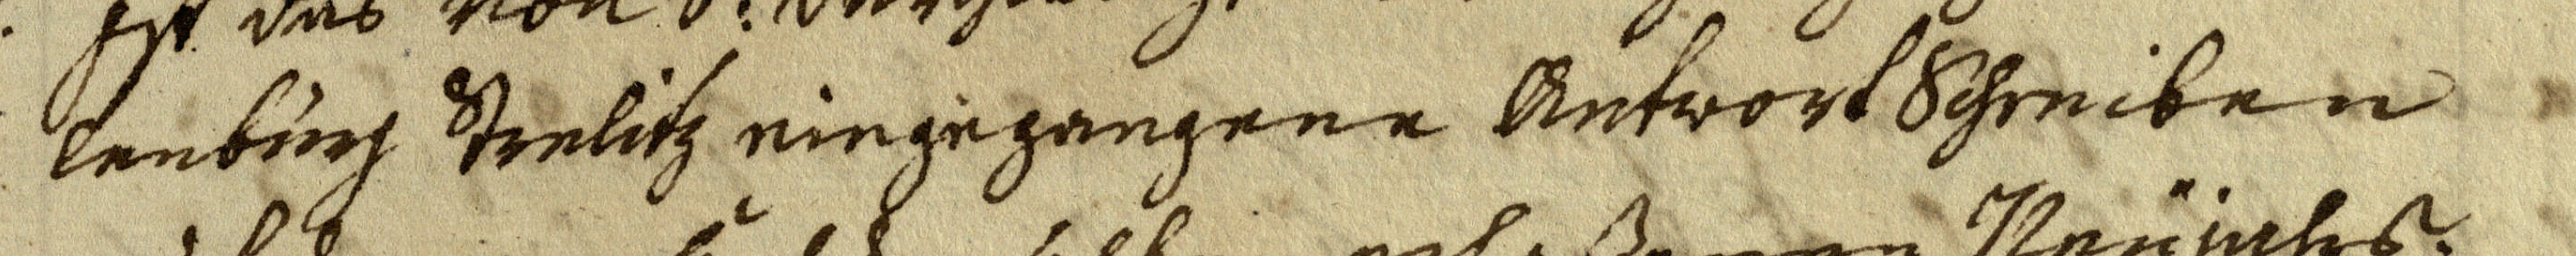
lenburg Strelitz eingegangene Antwort Schreiben
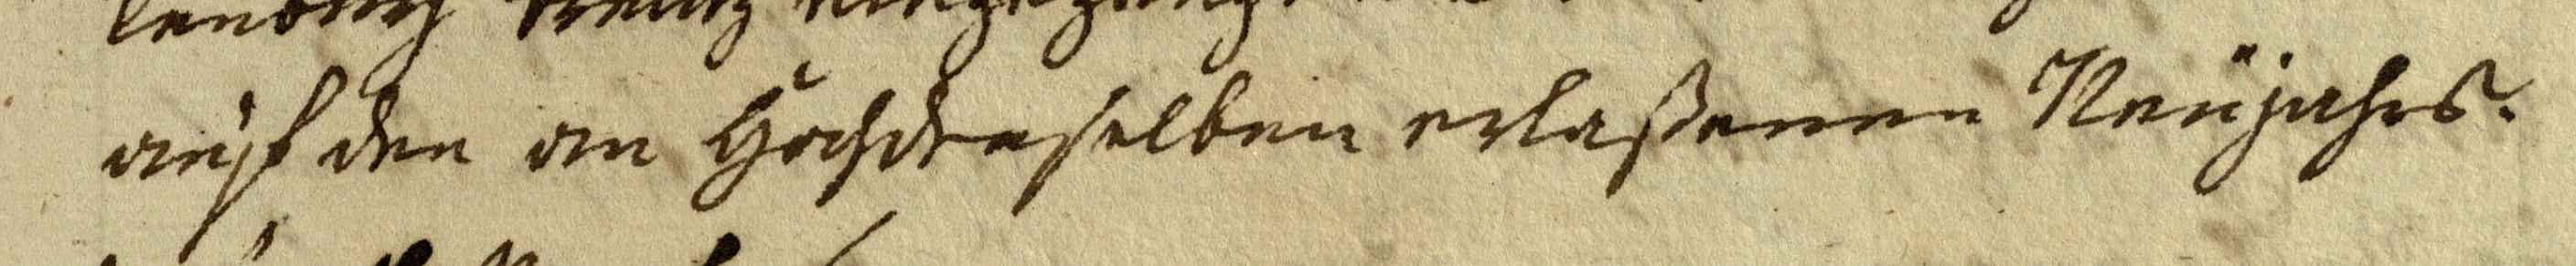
auf den an Hochdenselben erlaßenen Neujahres¬
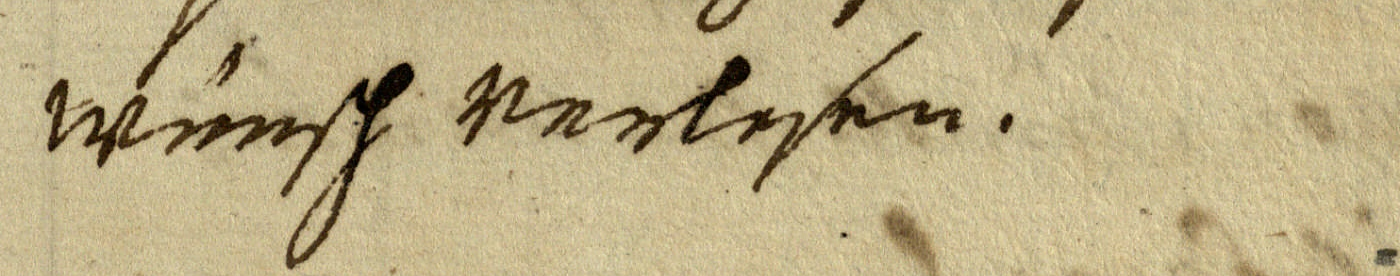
Wunsch verlesen.
